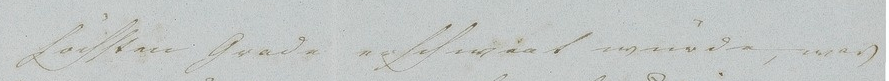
höchsten Grade erschwert würde, was
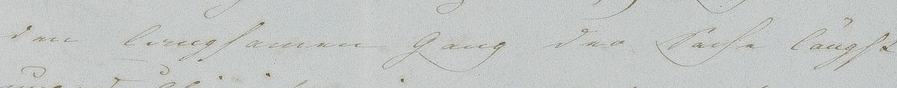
den langsamen Gang der Sache längst
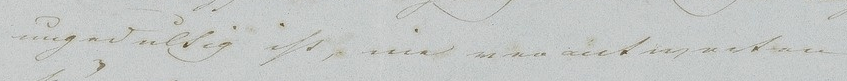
ungeduldig ist, nie verantworten
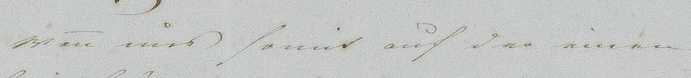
Wenn uns somit auf der einen
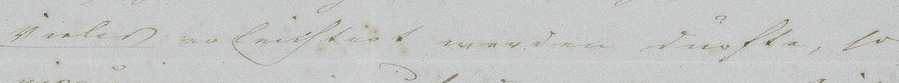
Vieles erleichtert werden dürfte, so
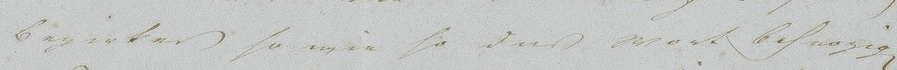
Bezirkes so wie so das Wort beherzigen
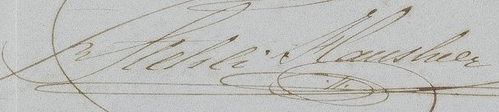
R Stehli Hausheer
